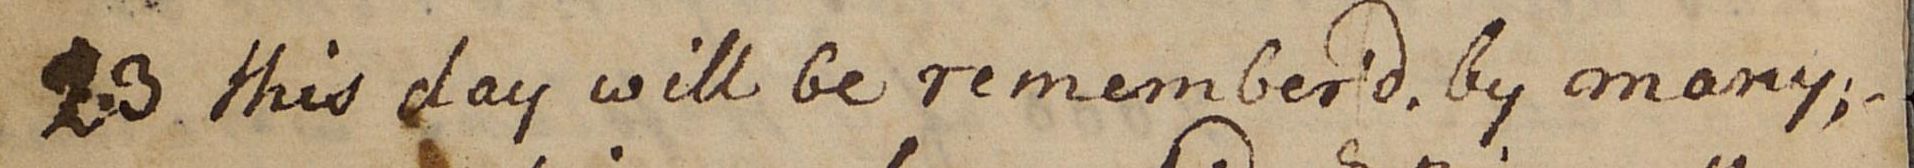23 this day will be remember'd, by many;-
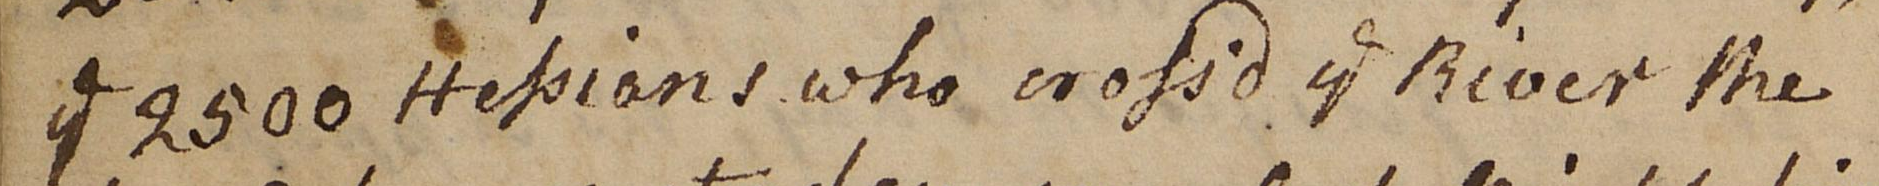y^e 2500 Hessians who cross'd y^e River the
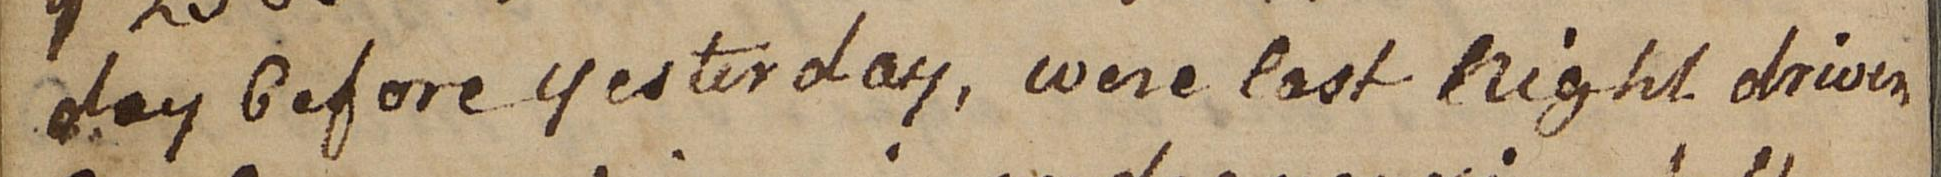day before yesterday, were last Night drivin
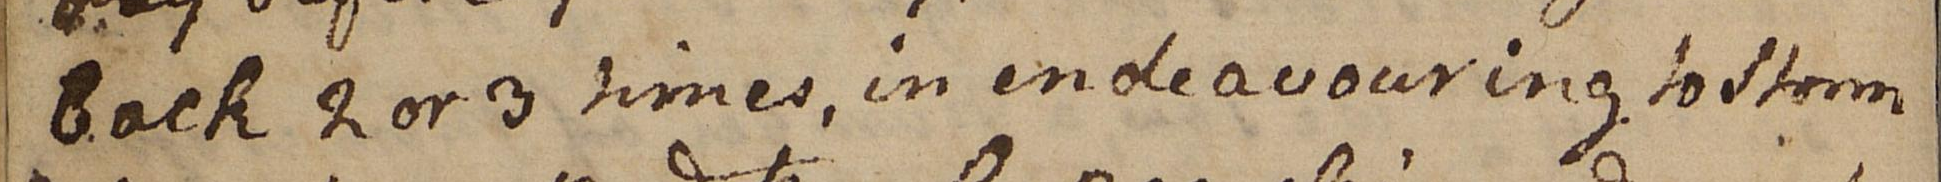back 2or 3 times, in endeavouring to Storm
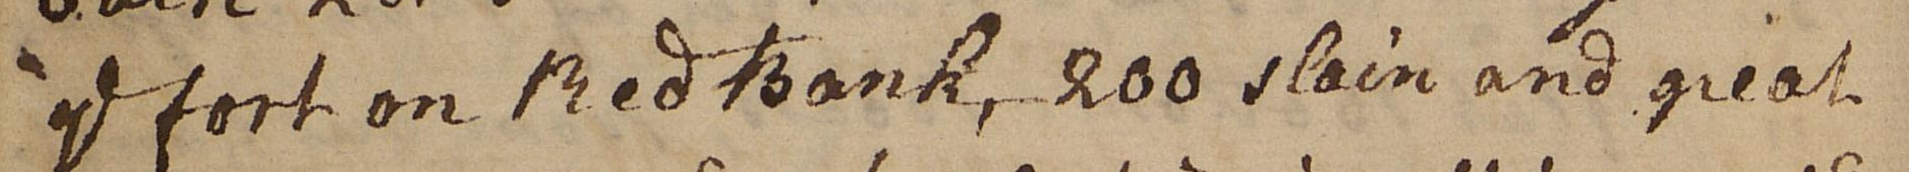y^e fort on Red Bank, 200 slain and great
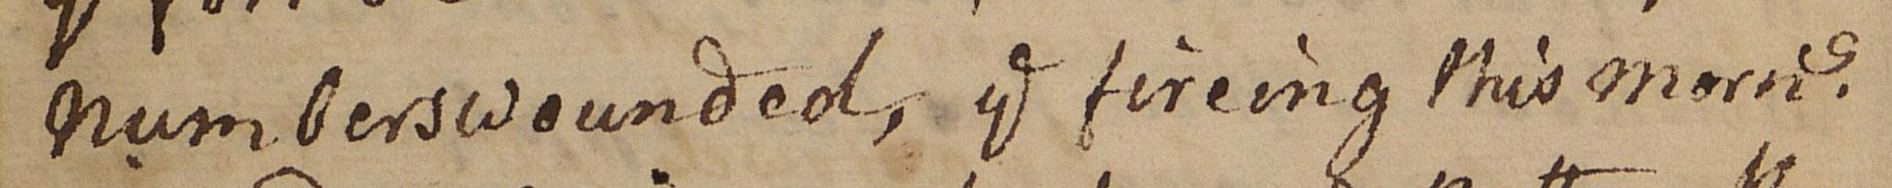Numbers wounded, y^e fireing this Morn^g.
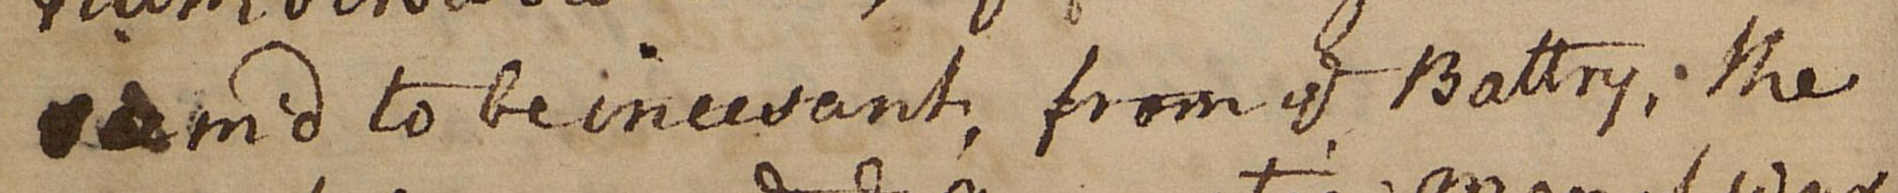seem'd to be incesant, from y^e Battry; the
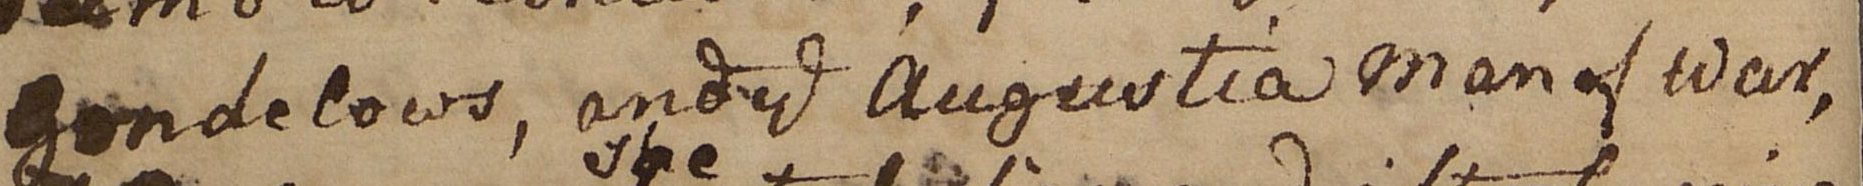Gondelows, and y^e Augustia Man of War,
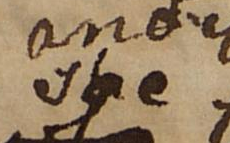she
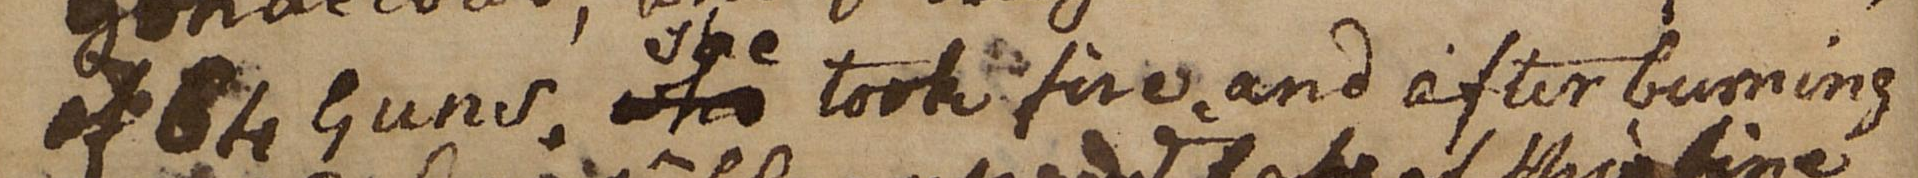of 64 Guns, [who] ^ took fire, and after burning
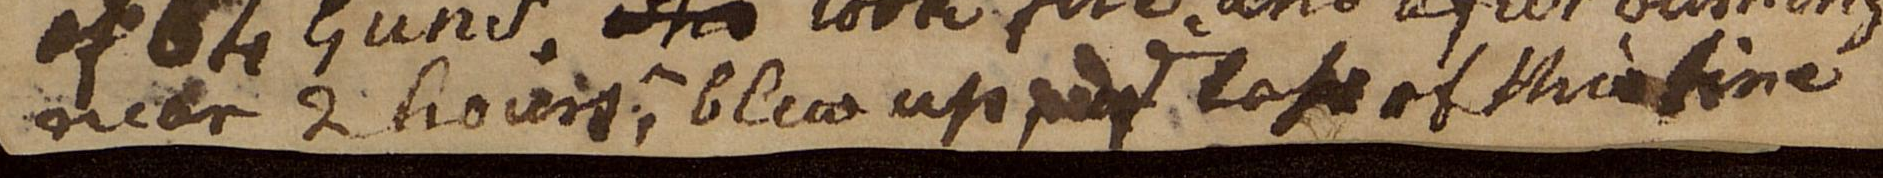near 2 hours, blew up y^e last of this fine
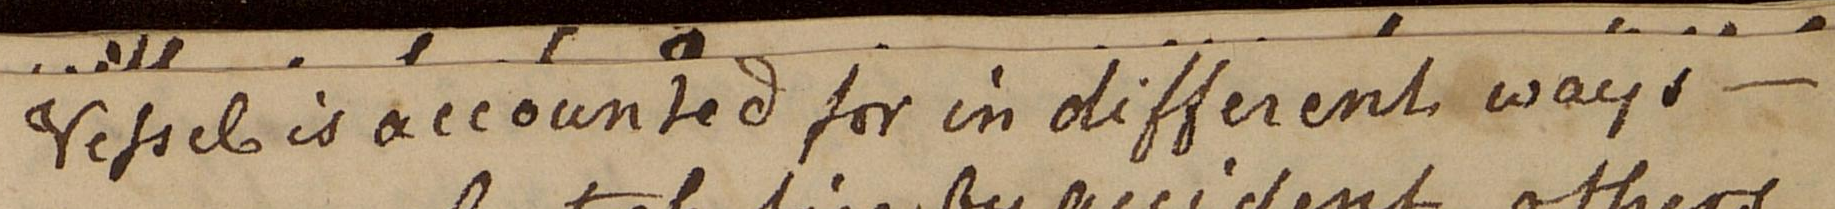Vessel, is accounted for in different ways-
